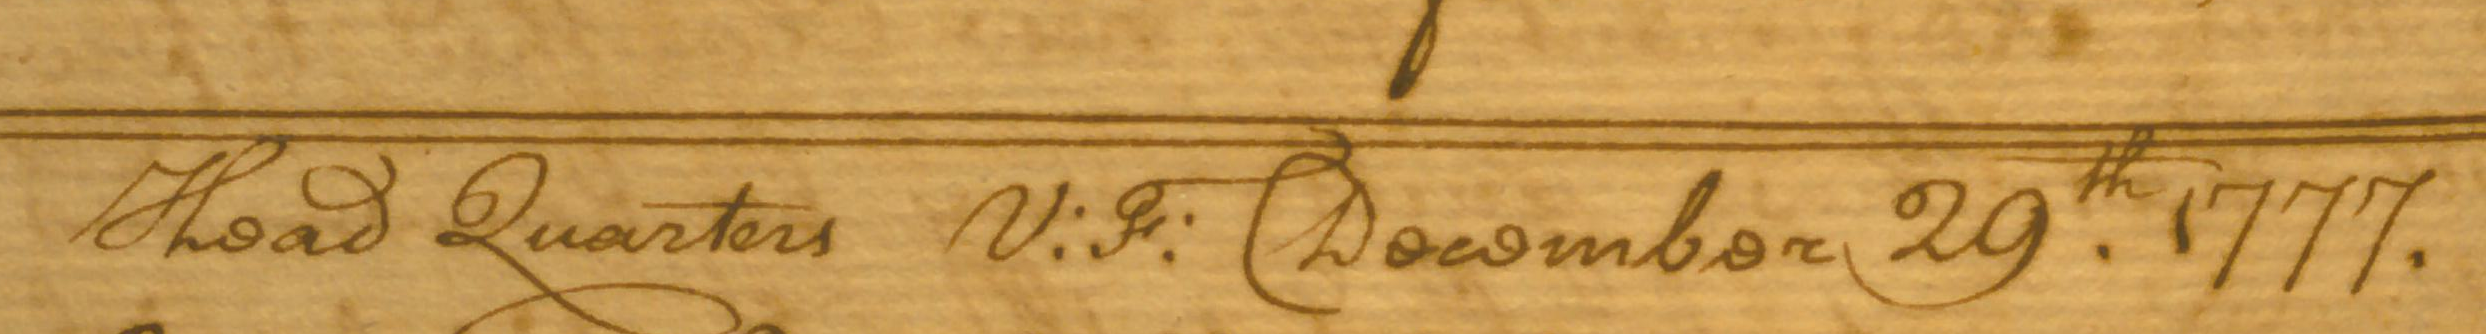Head Quarters V: F: December 29^th. 1777.
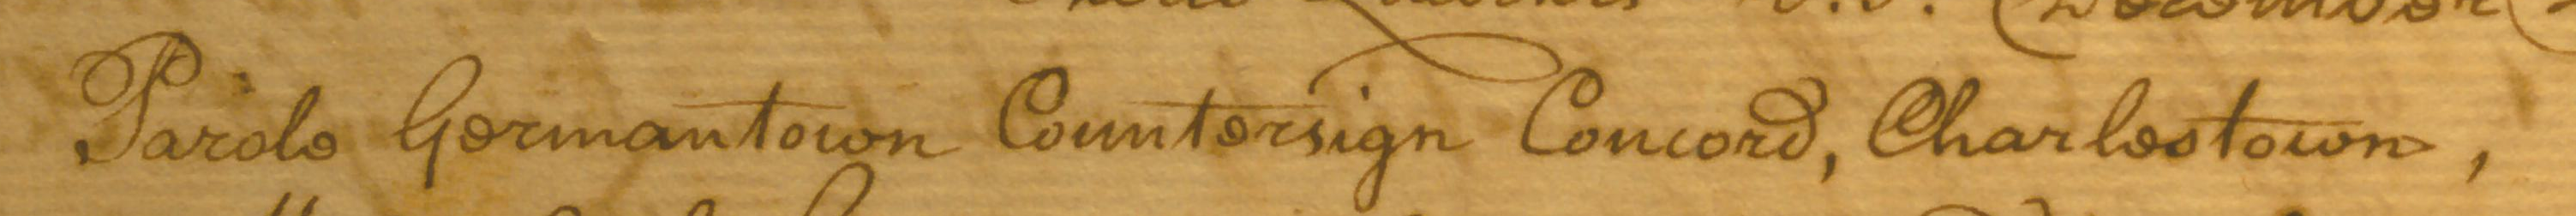Parole Germantown Countersign Concord, Charlestown,
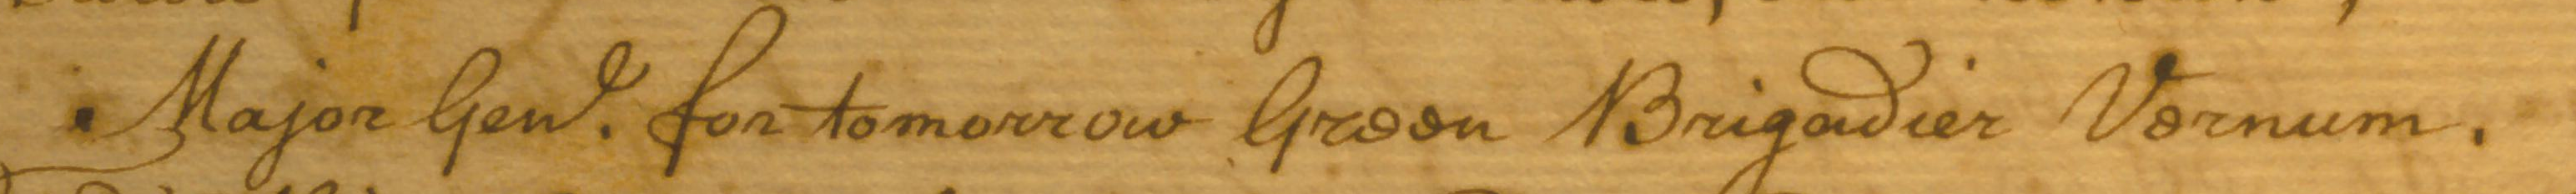Major Gen^l. for tomorrow Green Brigadier Vernum.
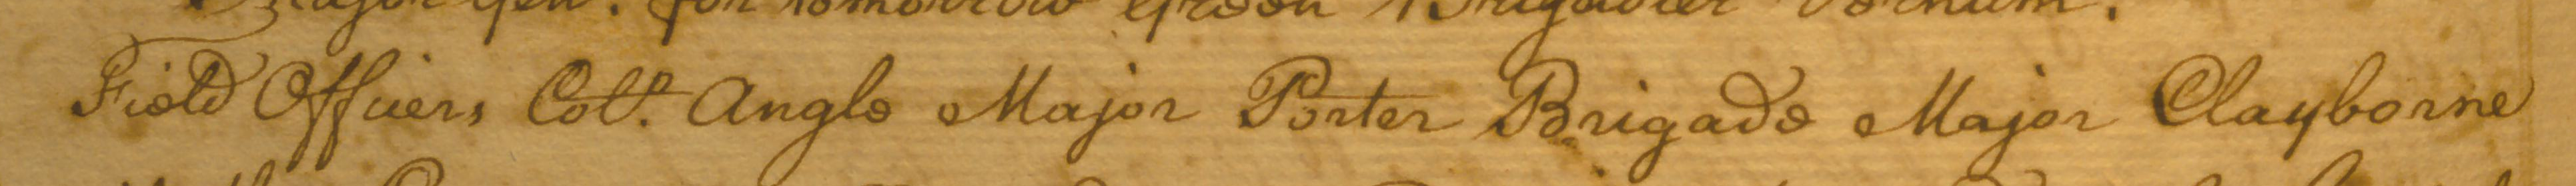Field Officers Col^o. Angle Major Porter Brigade Major Clayborne
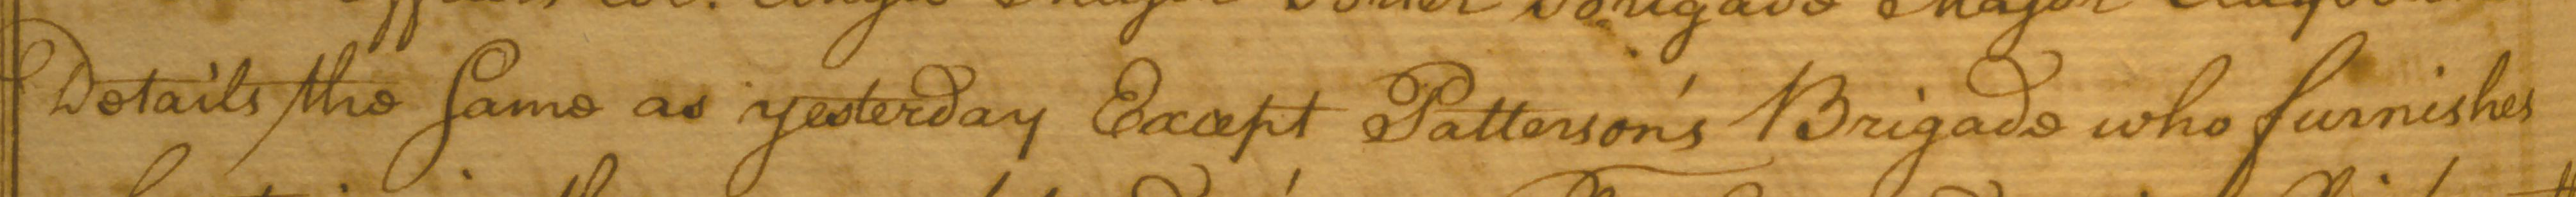Details the Same as yesterday Except Patterson's Brigade who furnishes
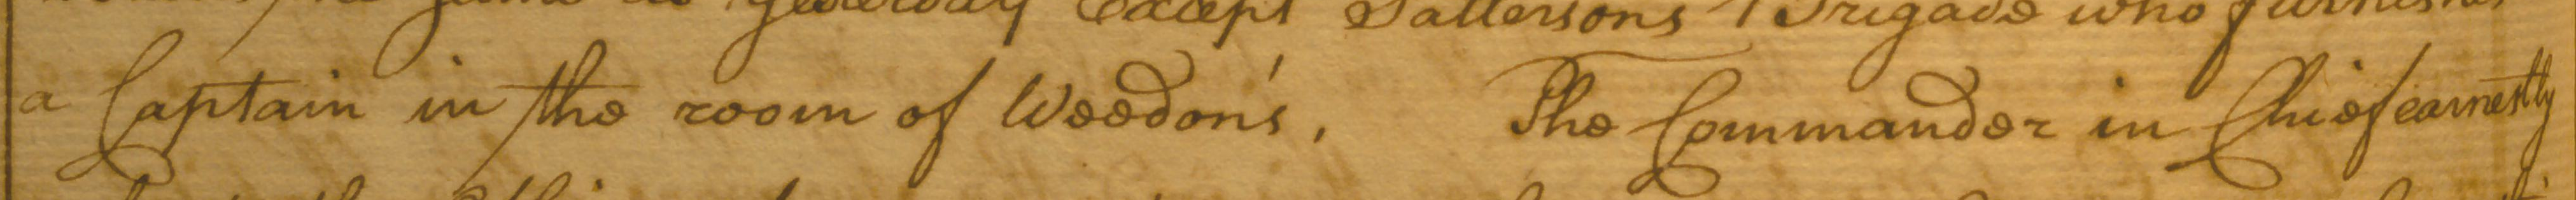Captain in the room of Weedon's. The Commander in Chief earnestly
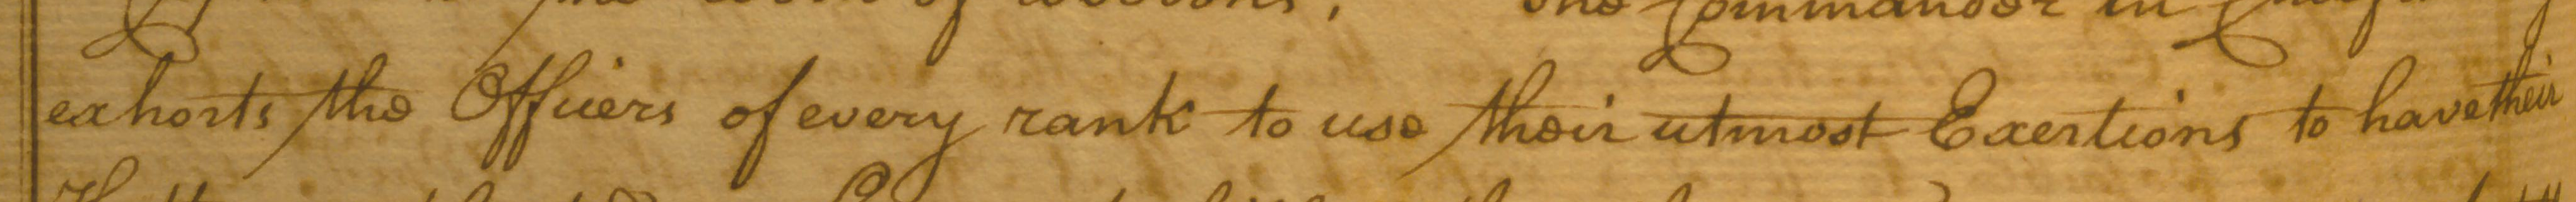exhorts the Officers of every rank to use their utmost Exertions to have their
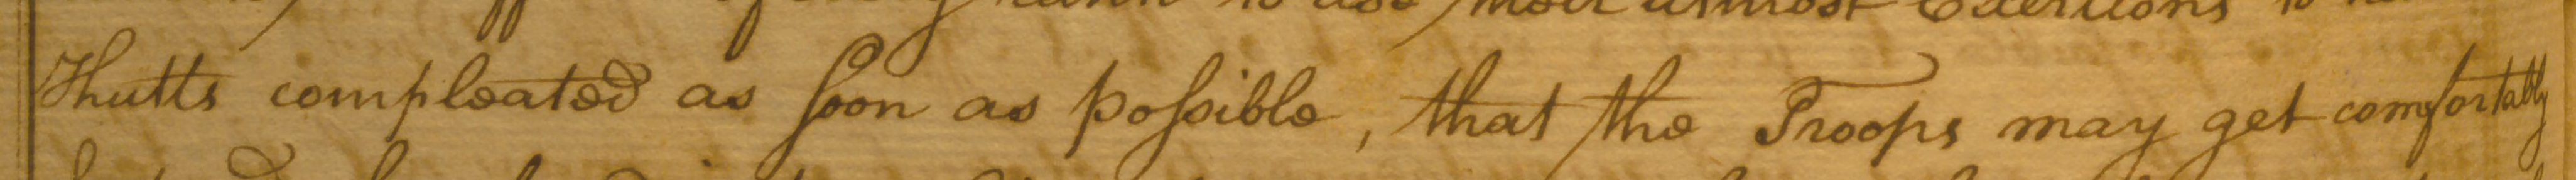Hutts compleated as soon as possible, that the Troops may get comfortably
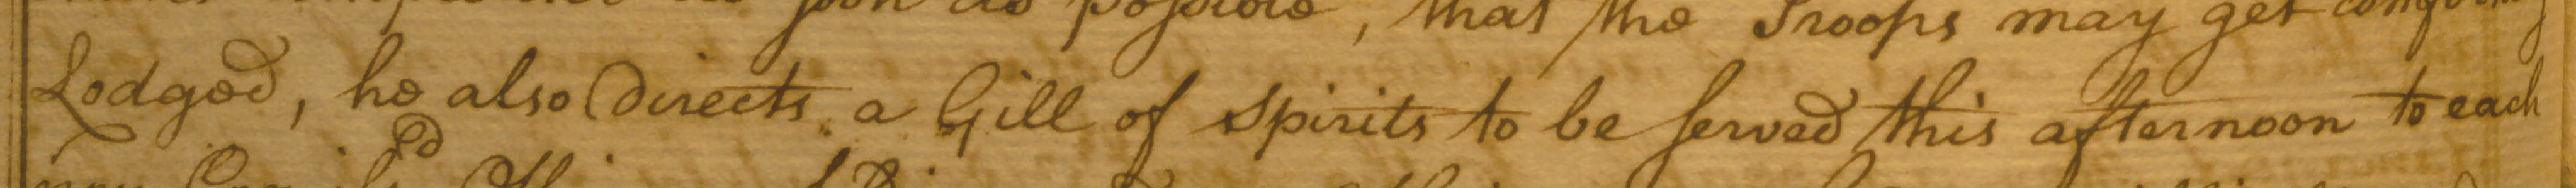Lodged, he also directs a Gill of spirits to be served this afternoon to each
